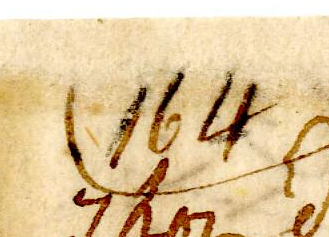164
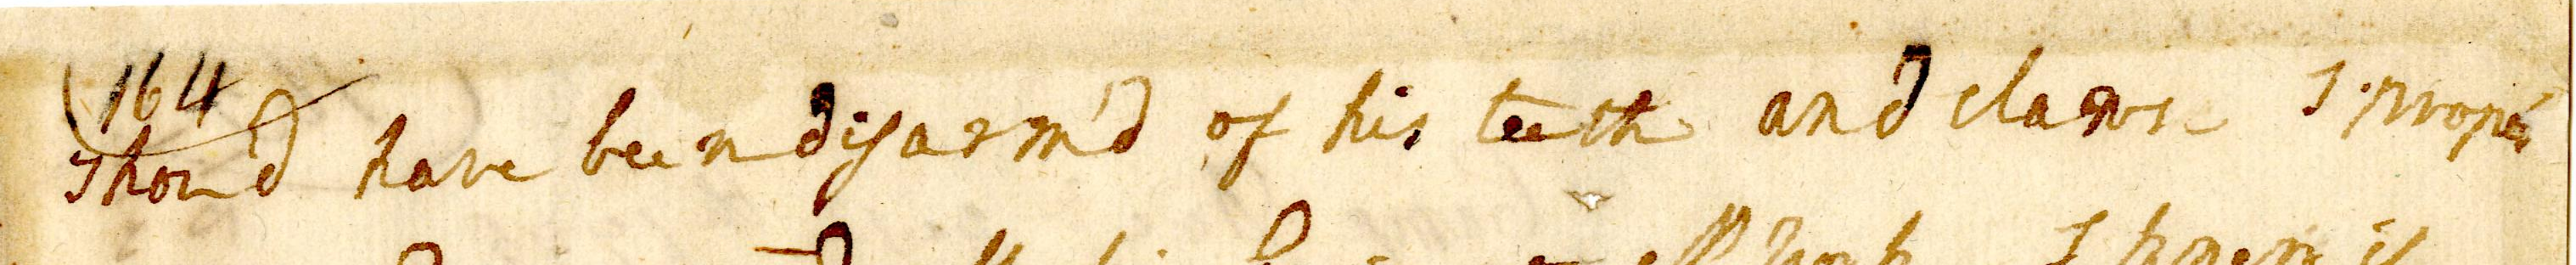shou'd have been disarm'd of his teeth and claws. I propose
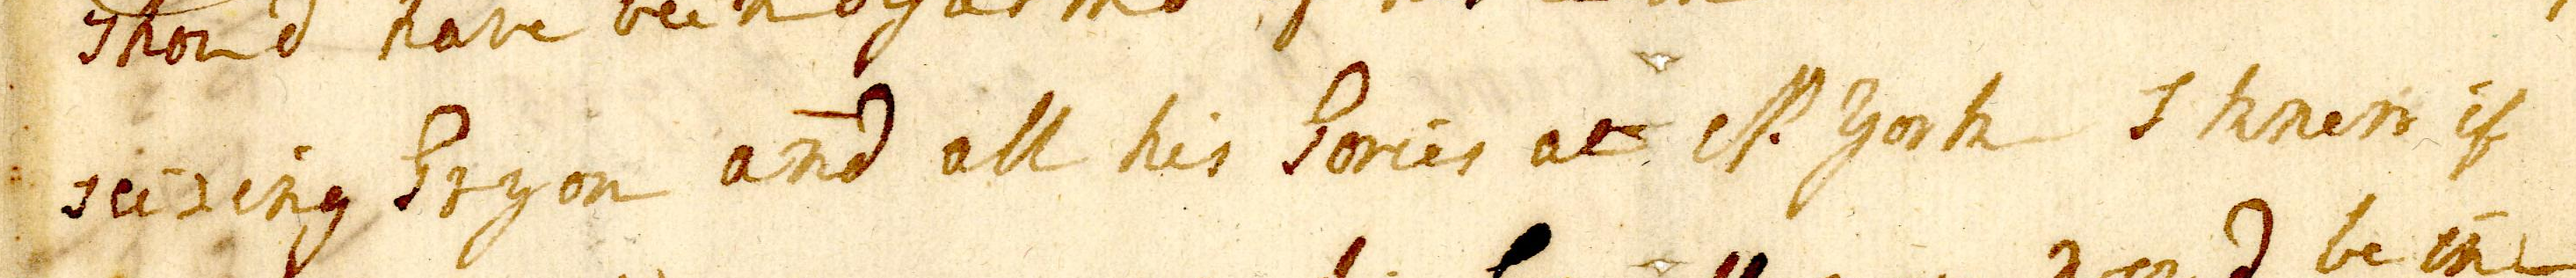seizing Tryon and all his Tories at N. York I know if
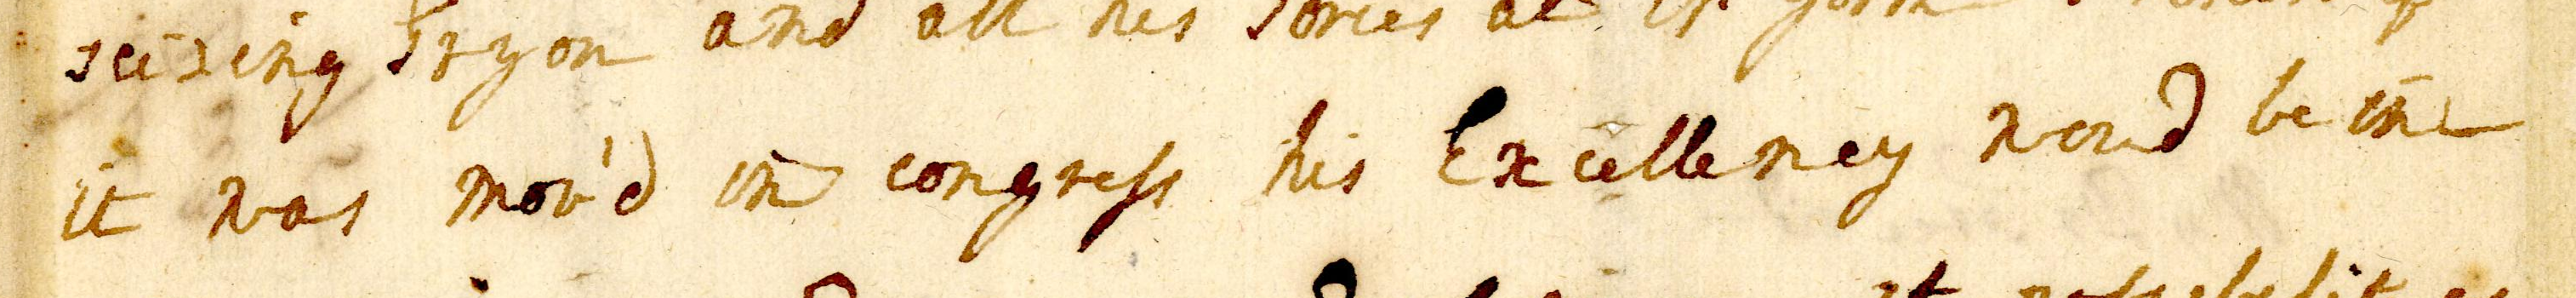it was mov'd in congress his Excellency woud be con-
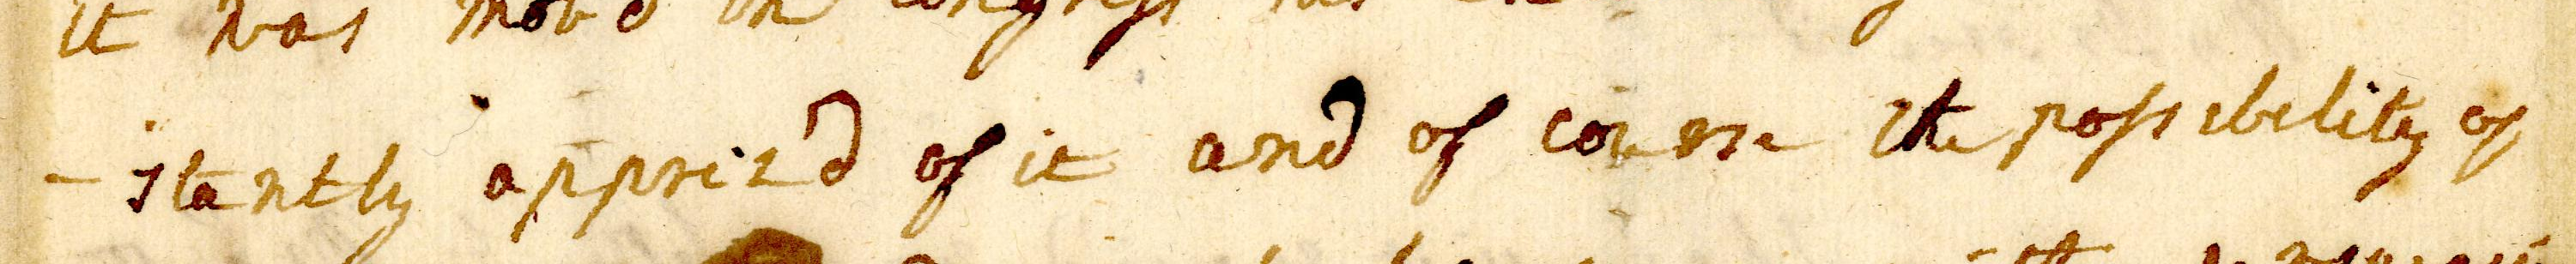-stantly appris'd of it and of course the possibility of
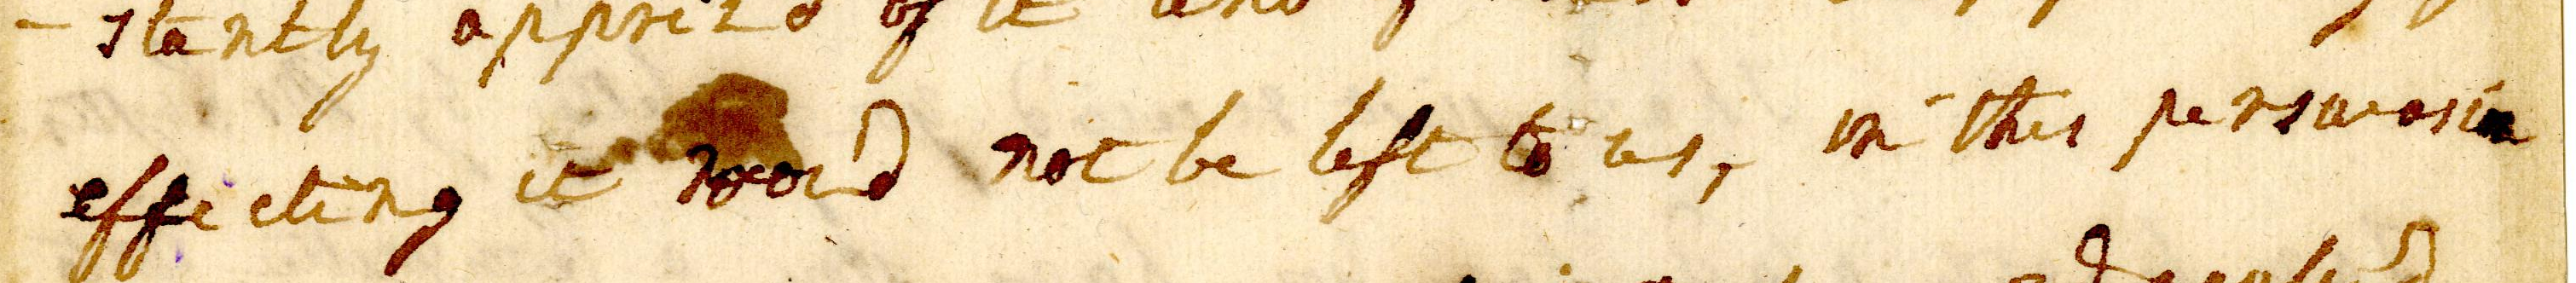effecting it woud not be left to us, in this persuasion
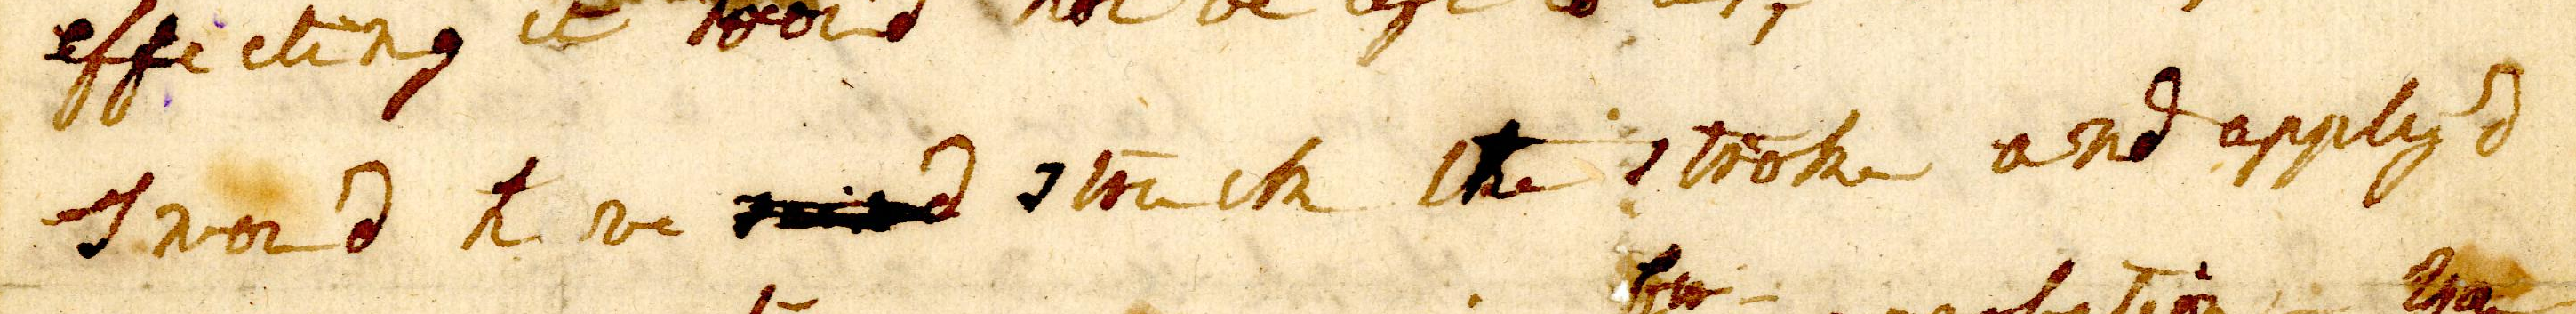I woud to be [____] struck the stroke and apply'd
